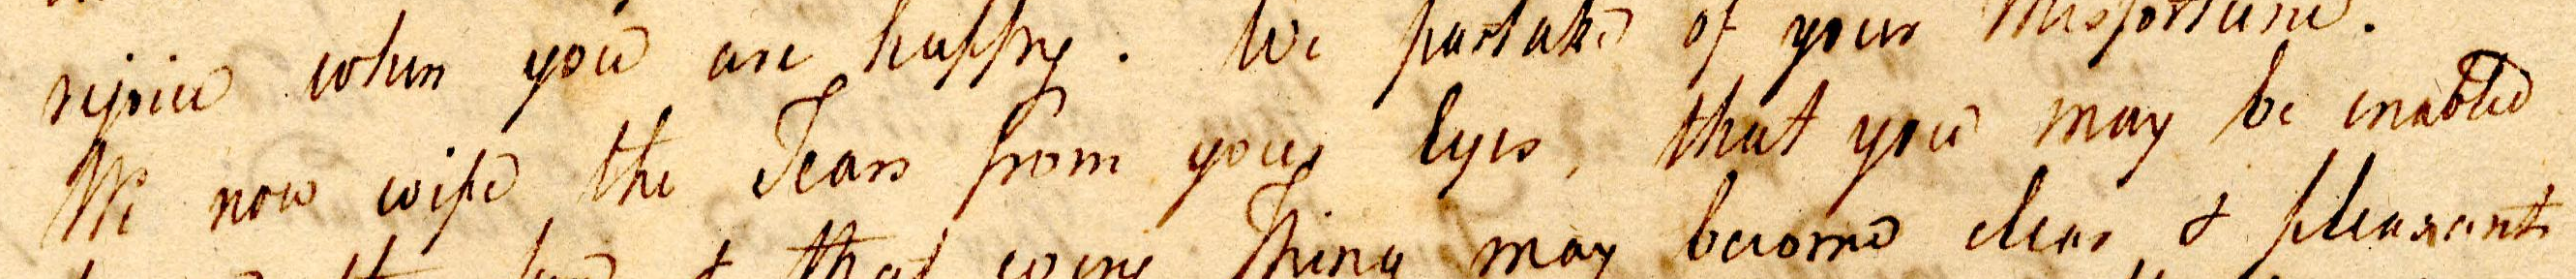We now wipe the Tears from your Eyes, that you may be enabled
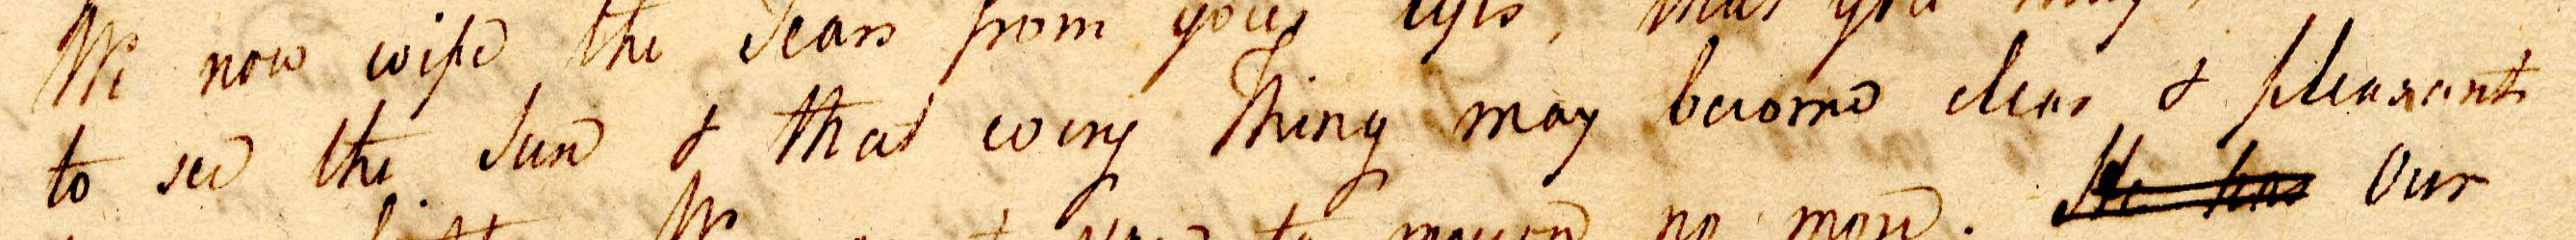to see the Sun & that every thing may become clean & pleasant
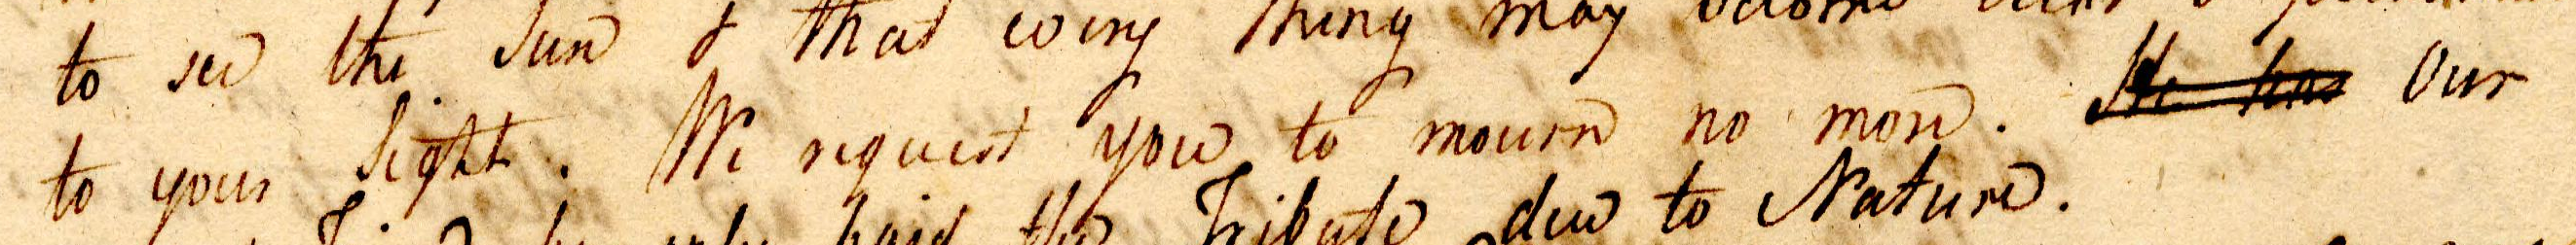to your Sight. We request you to mourn no more. He has Our
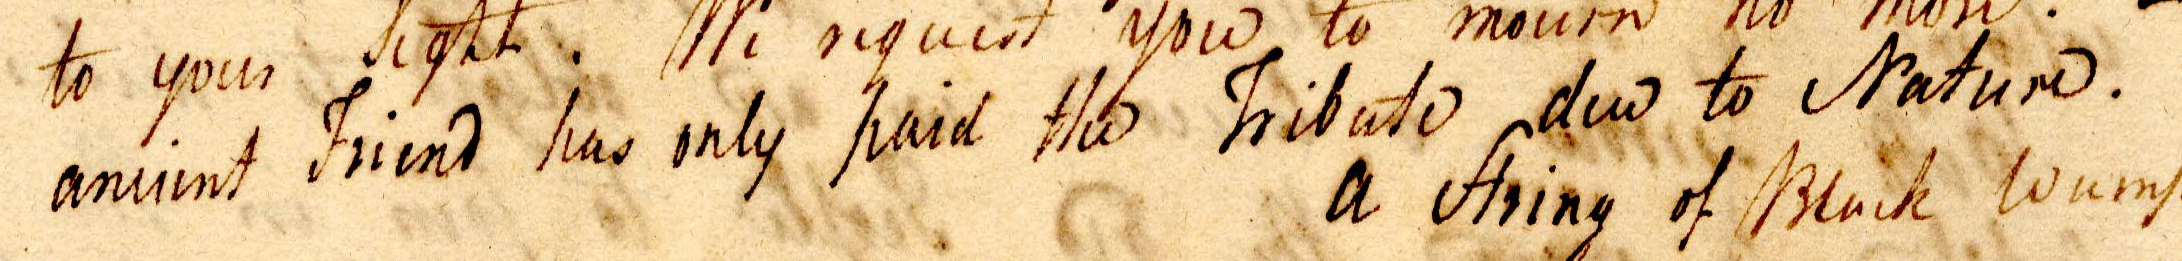ancient Friend has only paid the Tribute due to Nature.
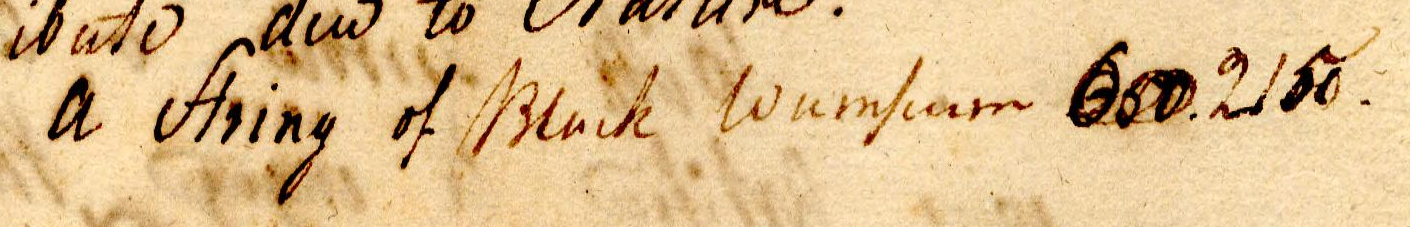A String of Black Wampum 600.2150.
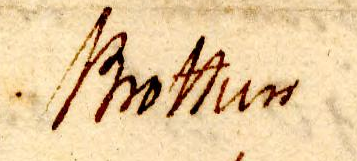Brothers
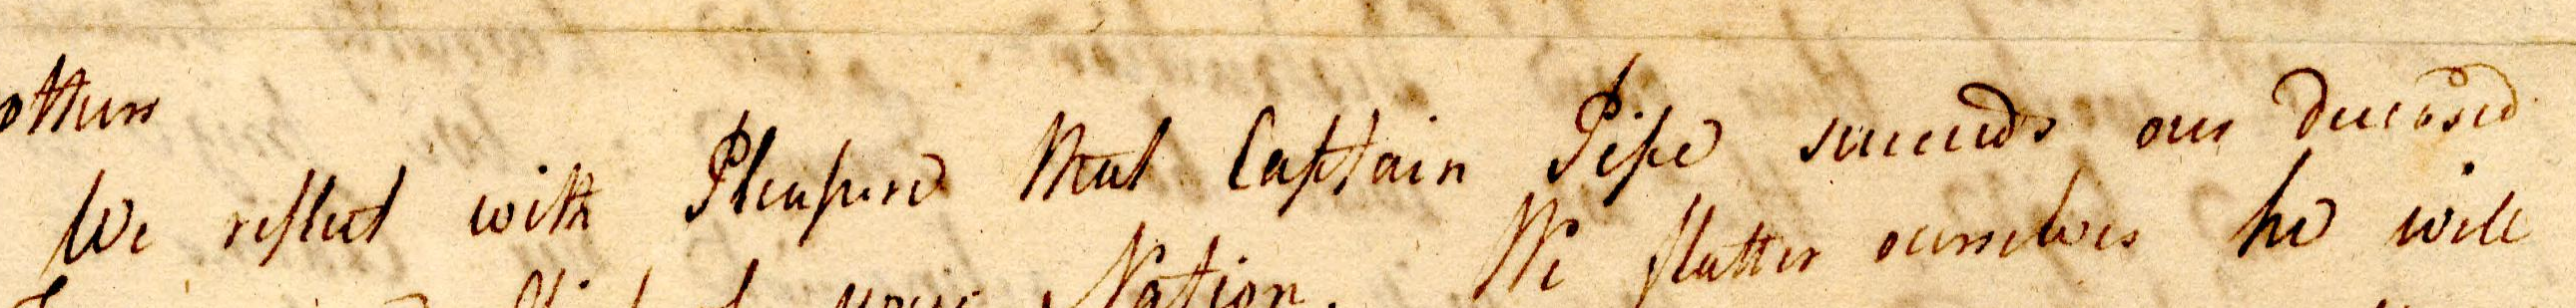We reflect with Pleasure that Captain Pipe succeeds our deceased
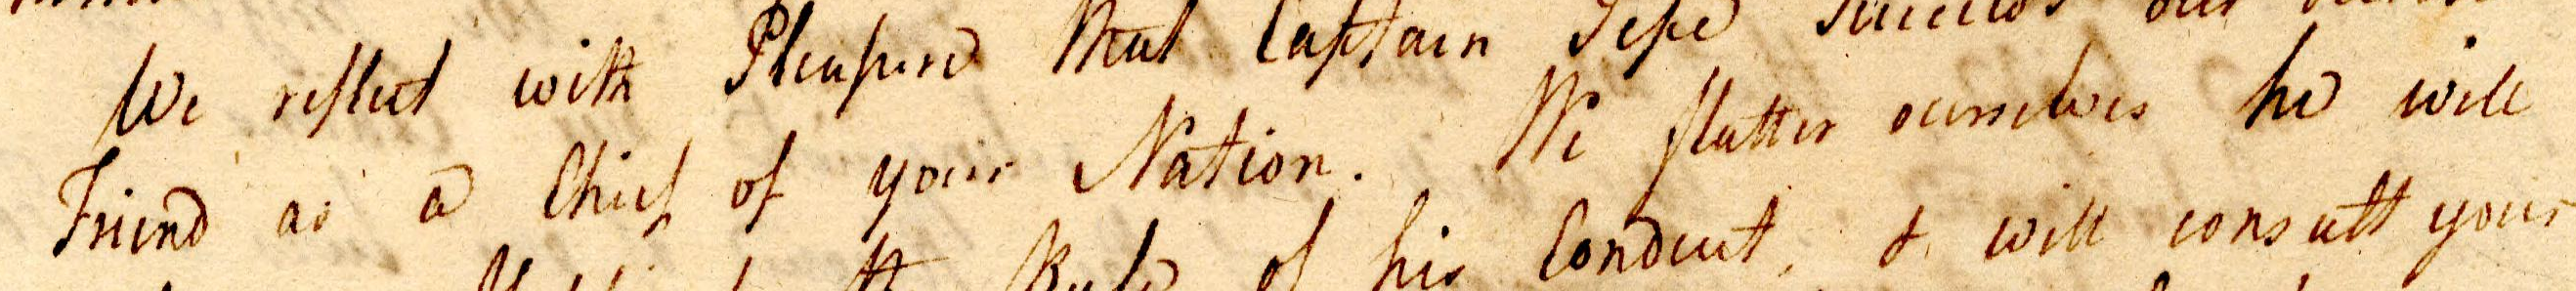Friend as a Chief of your Nation. We flatter ourselves he will
